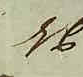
16
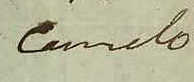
Camelo
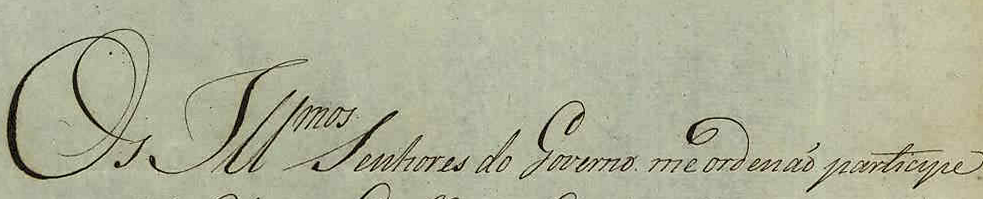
Os IIl.mos Senhores do Governo me ordenaraõ participe
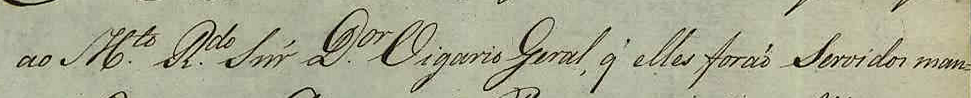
ao M.to R.do Snr̄. D.or Vigario Geral, q̄ elles foraõ Servidos man
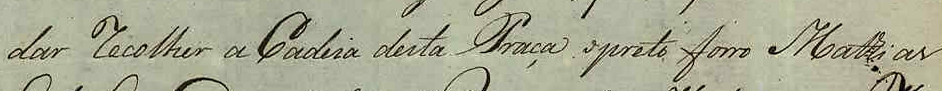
dar Recolher a Cadeia desta Praça o preto forro Mathias
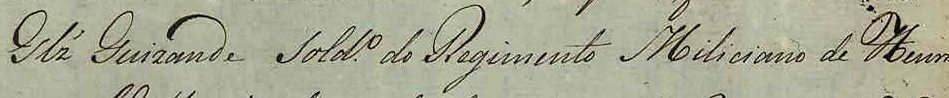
Glz̄ Guizande Sold.o do Regimento Miliciano de Henri
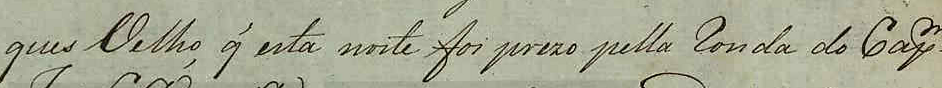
ques Velho, q̄ esta noite foi prezo pella Ronda do Cap.m
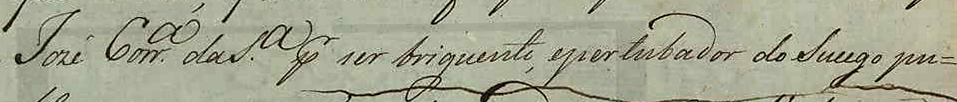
Iozé Corr.a da S.a p.r ser briguento, e pertubador do Sucego pu
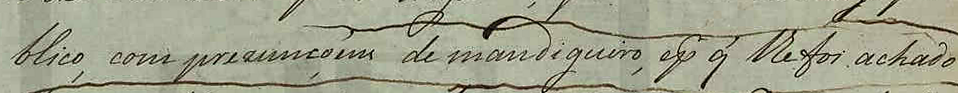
blico com prezunçoẽns de mandigueiro, e p.r q̄ lhe foi achado
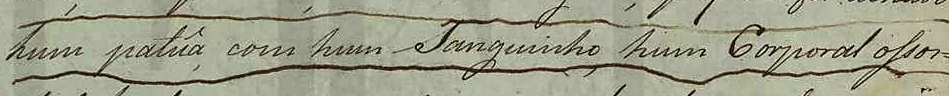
hum patuá, com hum Sanguinho, hum Corporal ossos
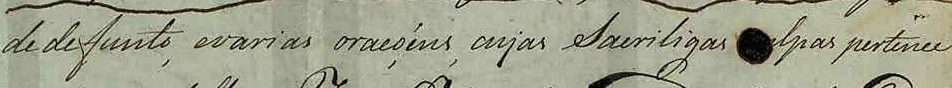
de defunto e varias oracoẽns, cujas Sacriligas _lpas pertence
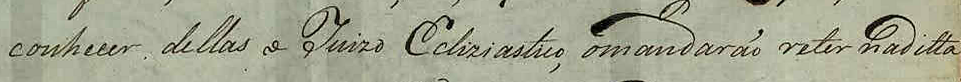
conhecer dellas o Iuizo Ecliziastico, o mandaraõ reter na ditta
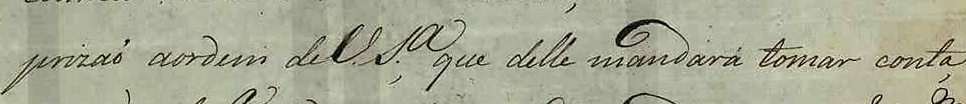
prizaõ a ordem de V. S.a, que delle mandará tomar conta,
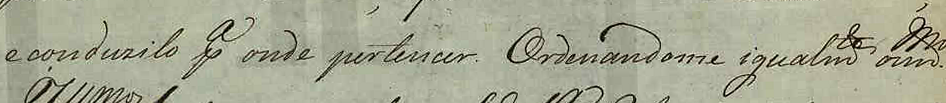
e conduzilo p.a onde pertencer. Ordenandome igualm.te os m.mos
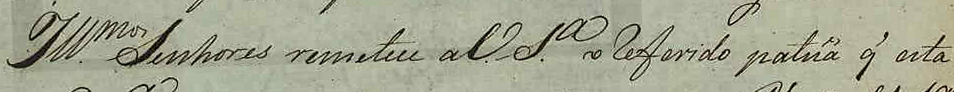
Ill.mos Senhores remeteu a V. S.a o Referido patuá q̄ esta
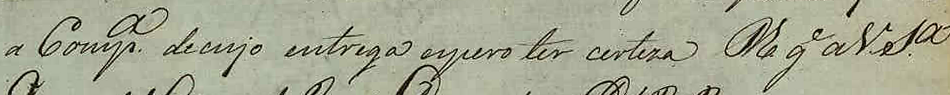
a Comp.a de cujo entrega espero ter certeza lhe g.e a V S.a
